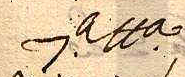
7.a tta
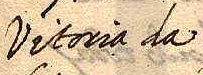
Vitoria da
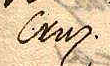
Cruz.
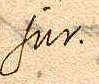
jur.
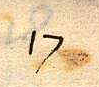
17
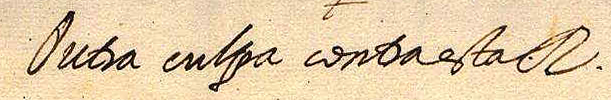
Outra culpa contra esta .R.
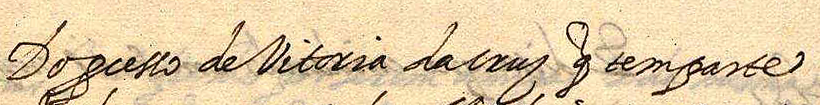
Do ꝓcesso de Vitoria da cruz q̄ tem parte
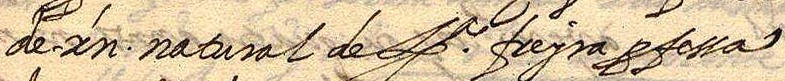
de xn. natural de Lxa. freyra ꝓfessa
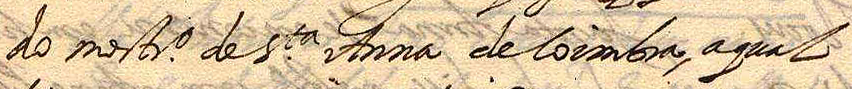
do mostr.o de s.ta Anna de Coimbra, a qual
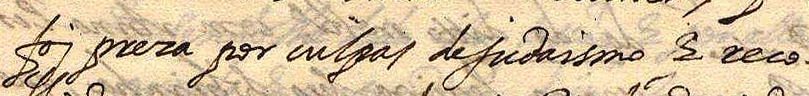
foj preza por culpas de judaismo E reco
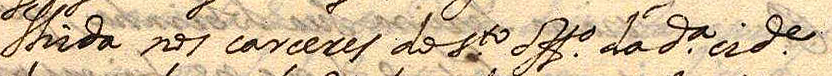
lhida nos carceres do s.to off.o da d.a cid.e
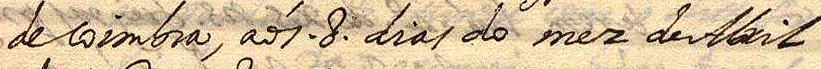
de coimbra, aos .8. dias do mez de Abril
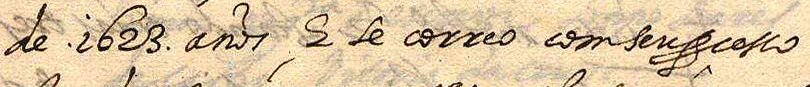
de .i623. an̄os E se correo com seu ꝓcesso
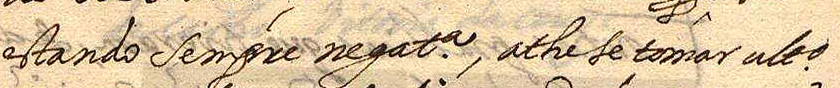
estando sempre negat.a, athe se tomar ult.o
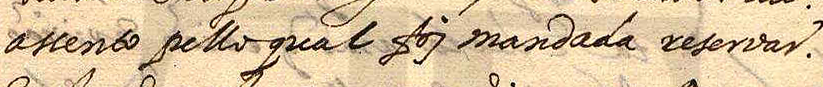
assento pello qual foj mandada reservar.
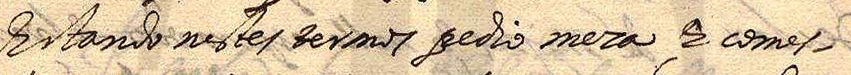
Estando nestes termos pedio meza, E comes
